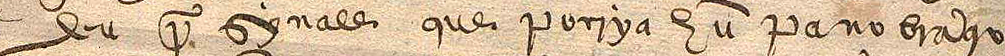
deu p̄o synall que poerya hū pano brāqo
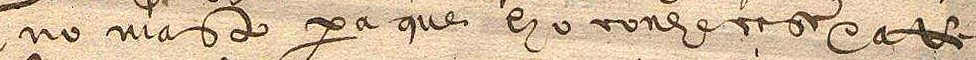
no masto ꝑa que ho conhecesē e a Re
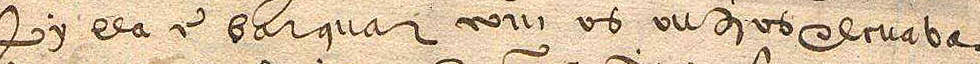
foy lla ēbarquar com os outros e leuava
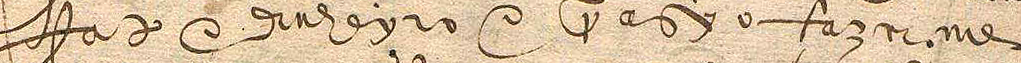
fato e dinheyro e p̄o asy o fazer me
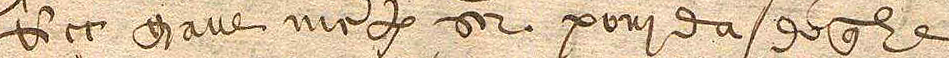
Rece grauemētꝭ ser ponjda / do q̄ he
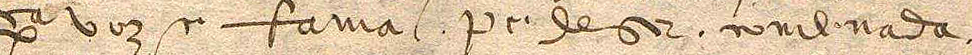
ꝑca voz e fama / pede ser condenada
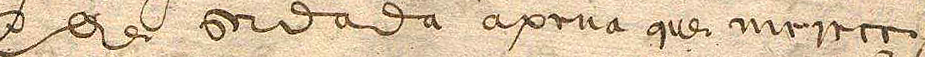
e lhe ser dada a pena que merece
